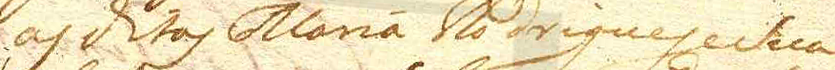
as ditas Maria Rodrigues e sua
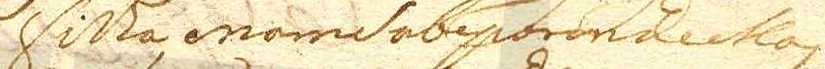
filha, e nam sabe por onde ellas
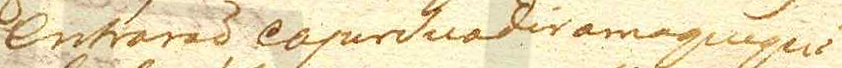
entraraõ, e a persuadiram a que qui
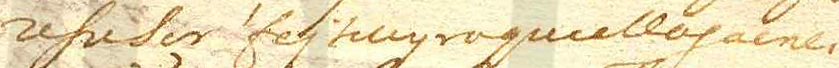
zesse ser fejteceyra que ellas a enci
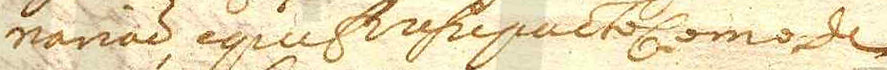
nariaõ, e que fizesse pacto Com o de
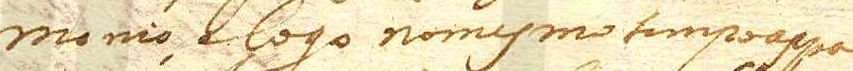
monio, e logo no mesmo tempo appa
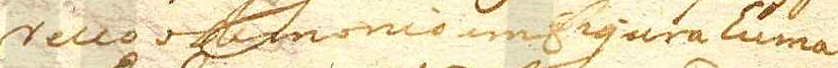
receo o demonio em figura huma
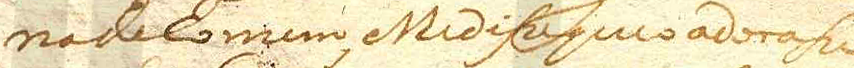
na de homem, e lhe disse que o adorasse
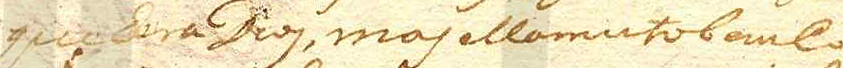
que hera Deos, mas ella muto bem co
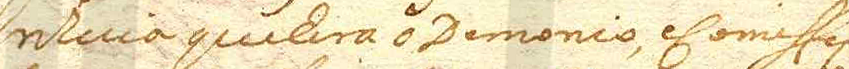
nhecia que hera o Demonio, e Com effej
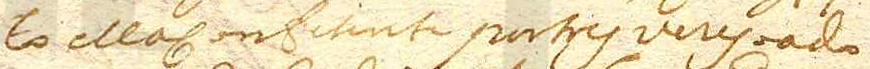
to ella Confitente por tres vezes o ado
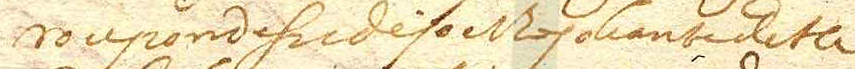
rou pondosse de joelhos diante delle
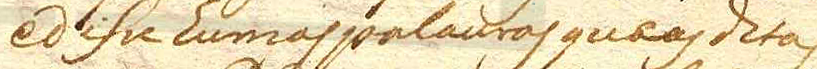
e disse humas palauras que as ditas
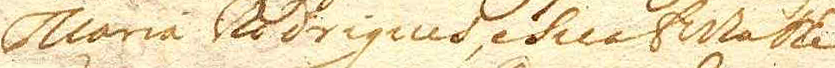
Maria Rodrigues, e sua filha lhe
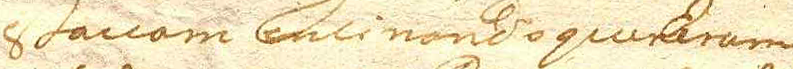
estauam encinando que heram
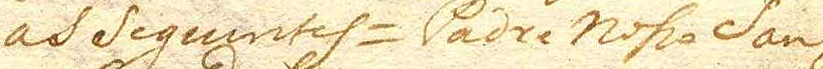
as seguintes = Padre nosso San
